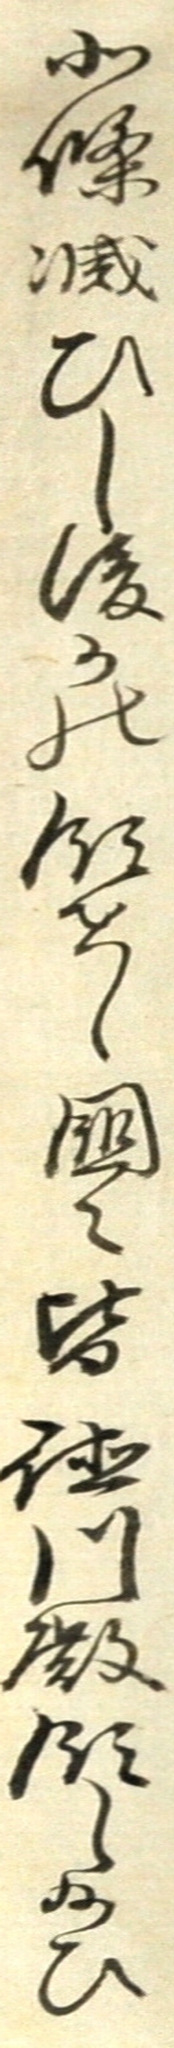北条滅ひし後かの領せし国々皆徳川殿領し給ひ

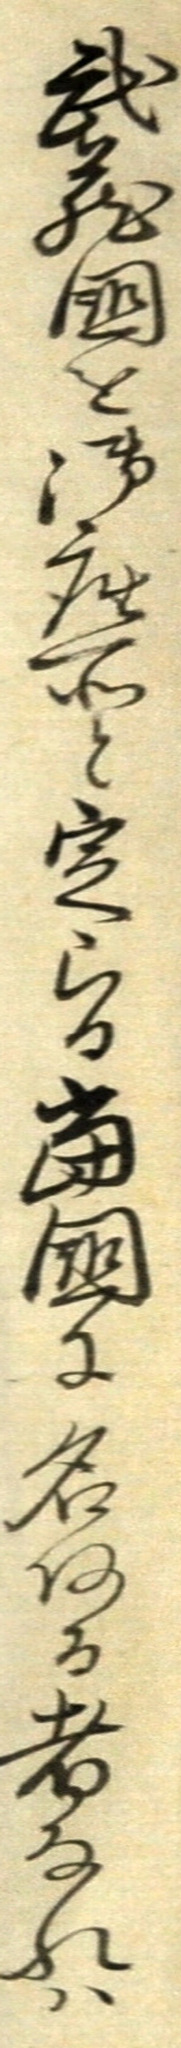武蔵国を御座所と定らる当国に名ある者なれは
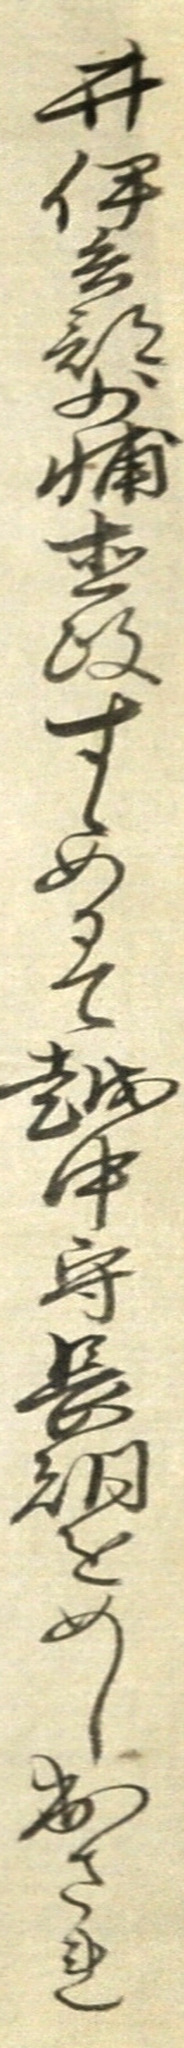井伊兵部少輔直政すゝめにて越中守長朝をめし出され
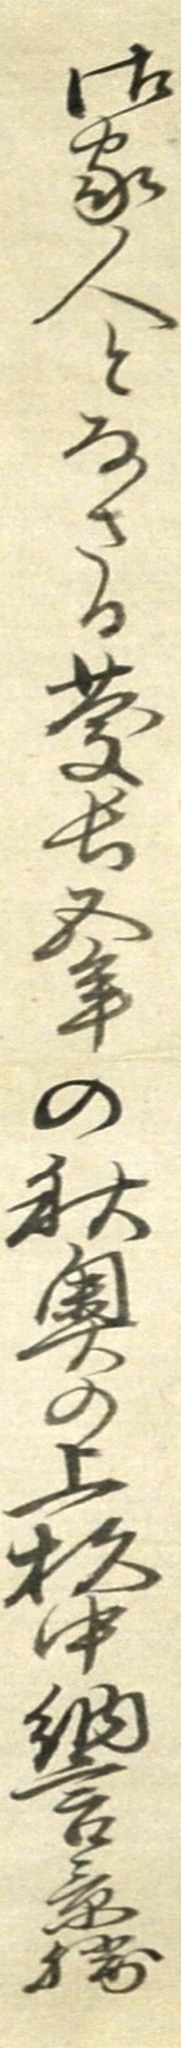御家人となさる慶長五年の秋奥の上杉中納言景勝
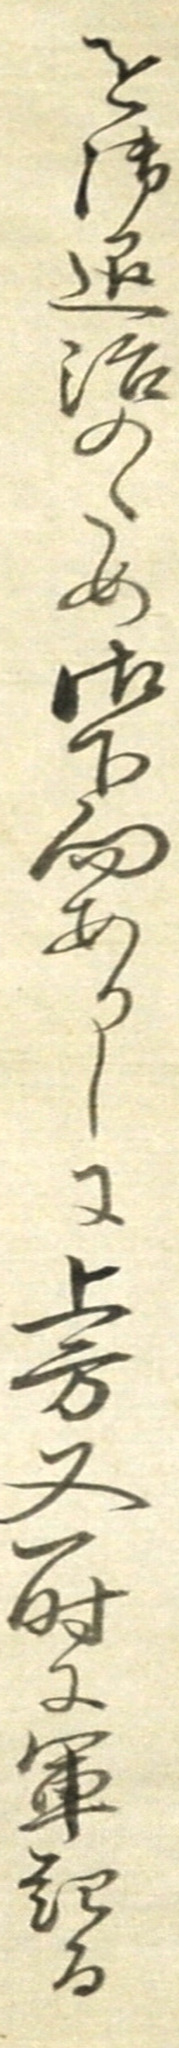を御退治のため御下向ありしに上方又一時に軍起る
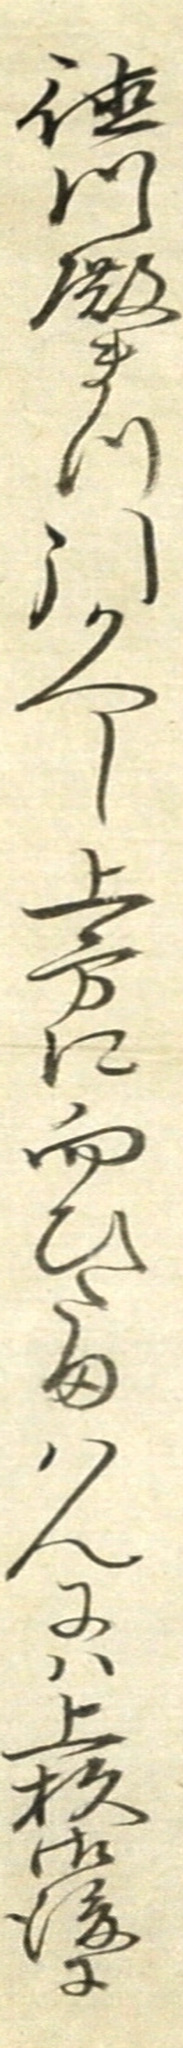徳川殿まつ引かへし上方に向ひたまはんに上杉御後に
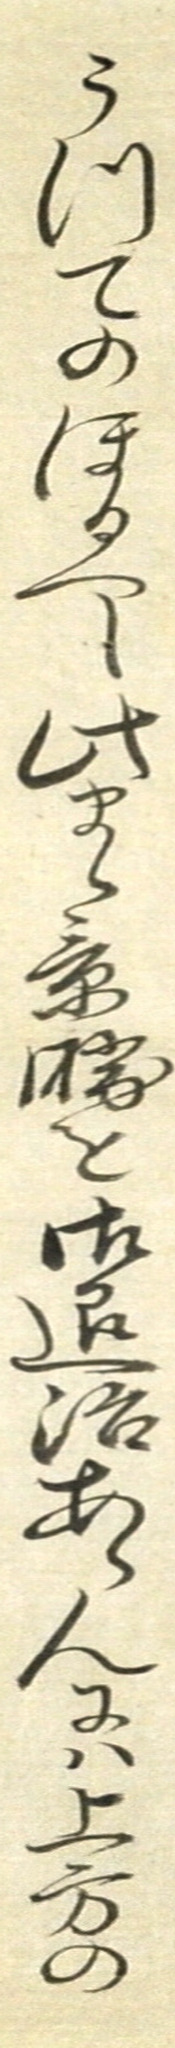うつてのほるへし此まゝ景勝を御退治あらんには上方の
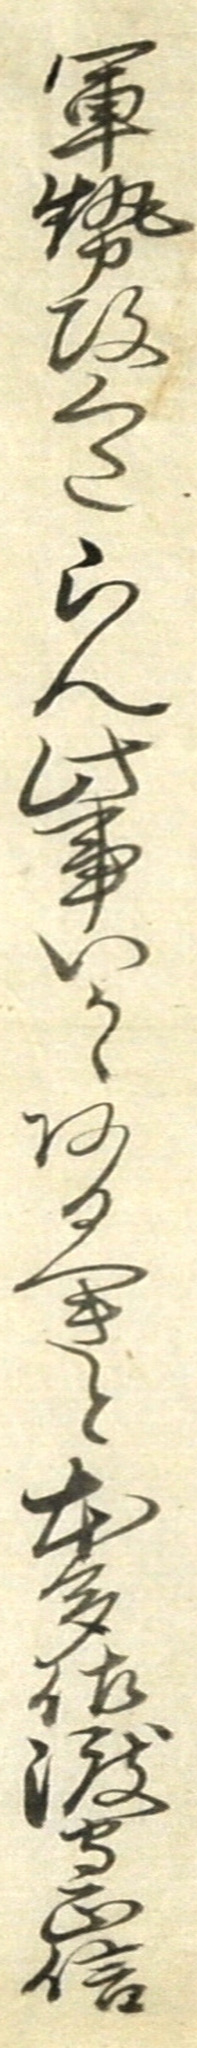軍勢攻くたらん此事いかゝあるへきと本多佐渡守正信
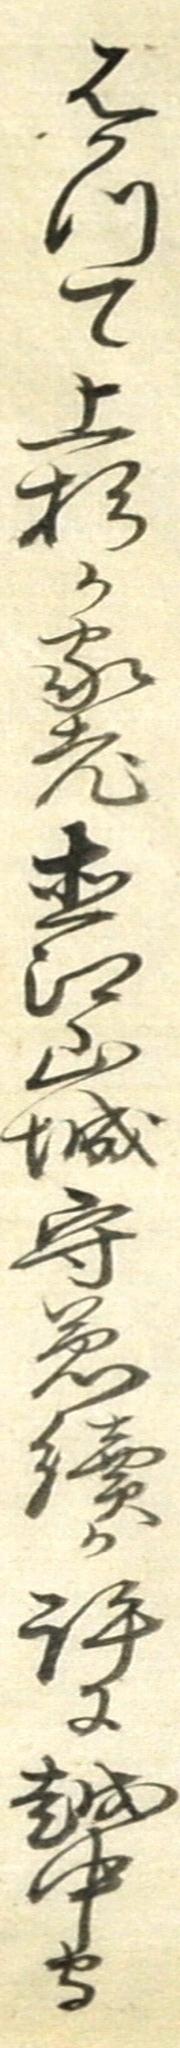はかつて上杉か家老直江山城守兼続か許に越中守
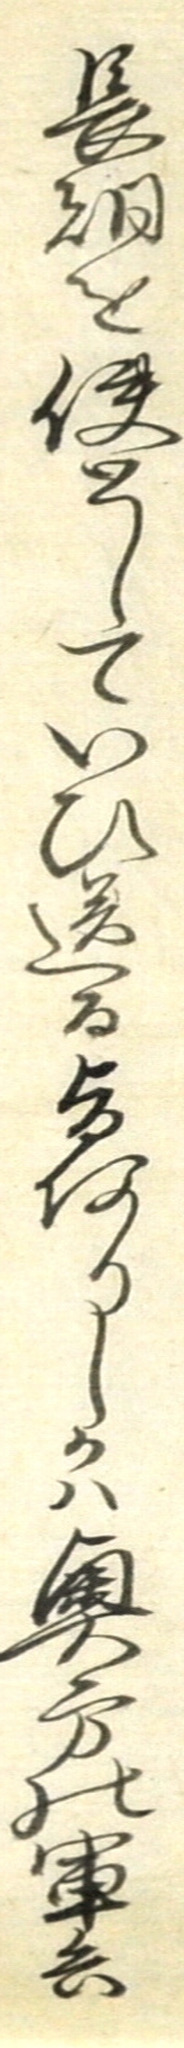長朝を使としていひ送る旨ありしかは奥方の軍兵
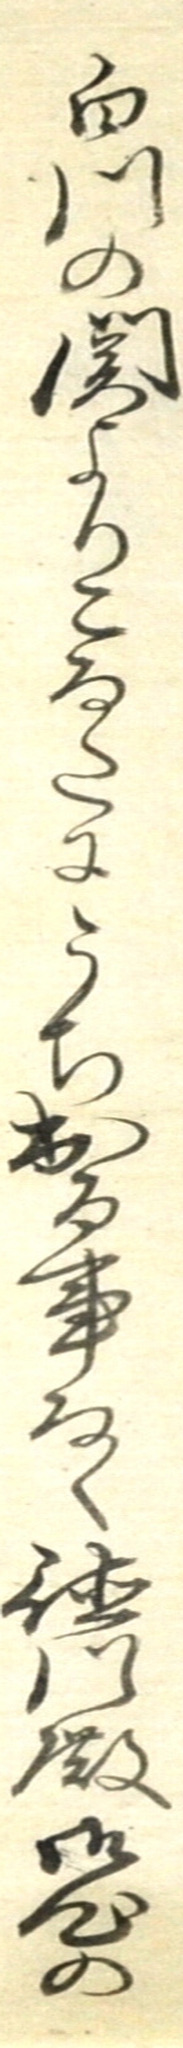白川の関よりこなたにうち出る事なく徳川殿御心の
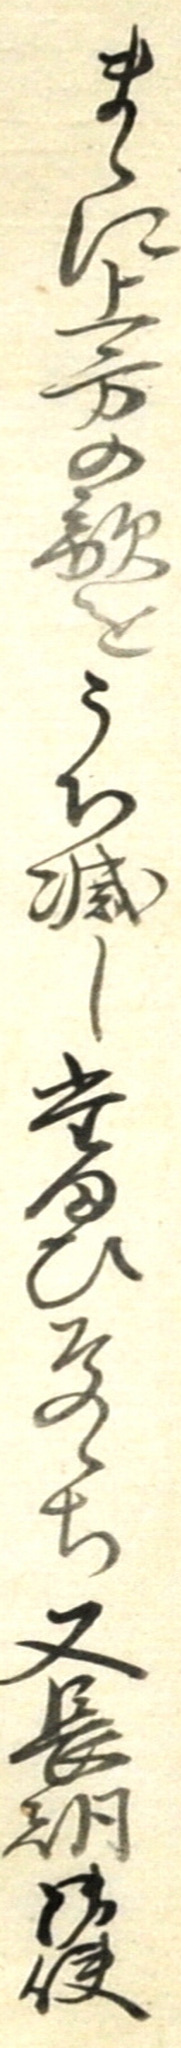まゝに上方の敵をうち滅したまひそのゝち又長朝御使
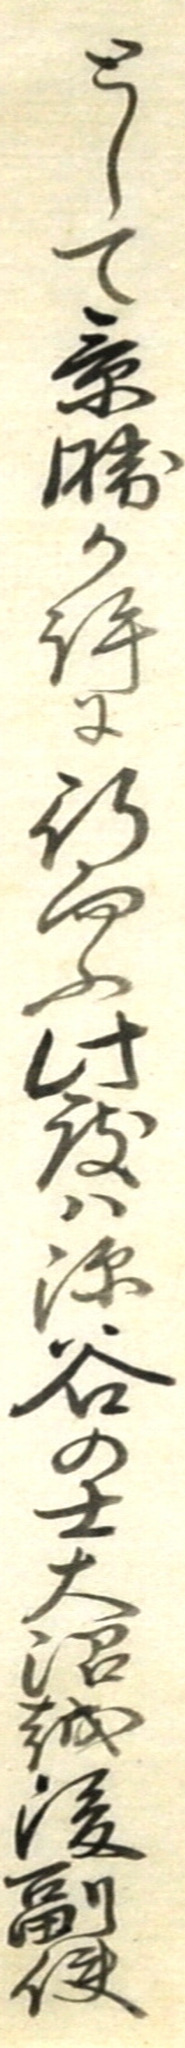として景勝か許に行向ふ此度は深谷の士大沼越後副使
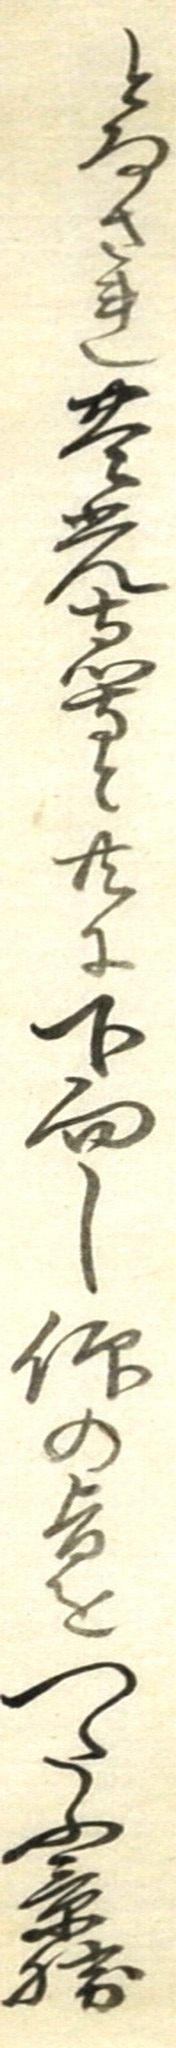となされ豊光寺等と共に下向し仰の旨をつたふ景勝
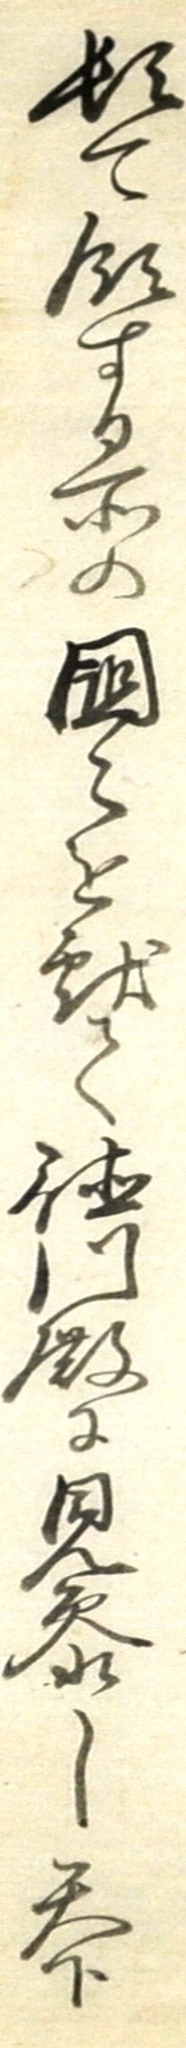頓て領する所の国々を献て徳川殿に見参し天下
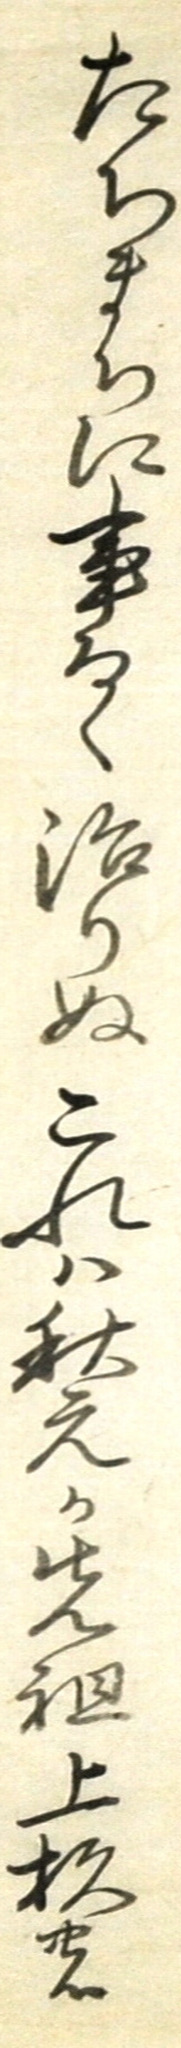たちまちに事なく治りぬこれは秋元か先祖上杉の
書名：藩翰譜（六）
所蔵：伊那市立高遠町図書館・合同会社AMANE
